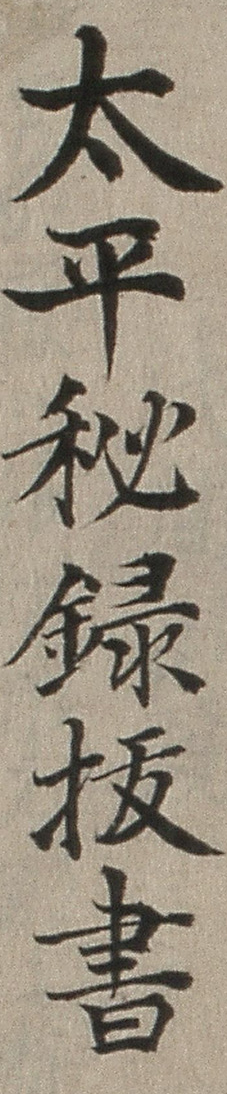太平秘録抜書
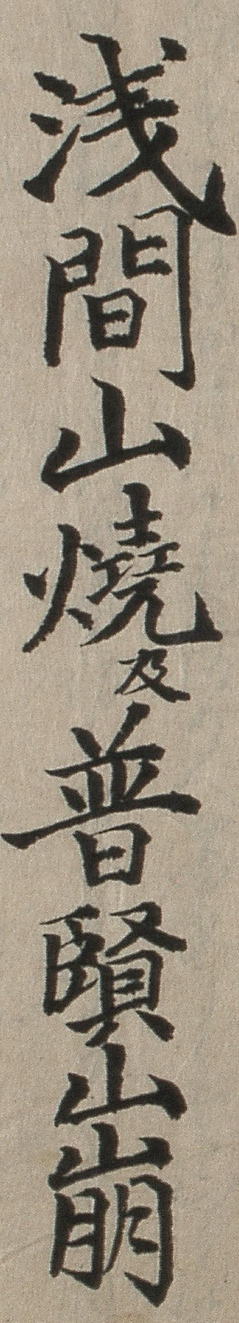浅間山焼及普賢山崩

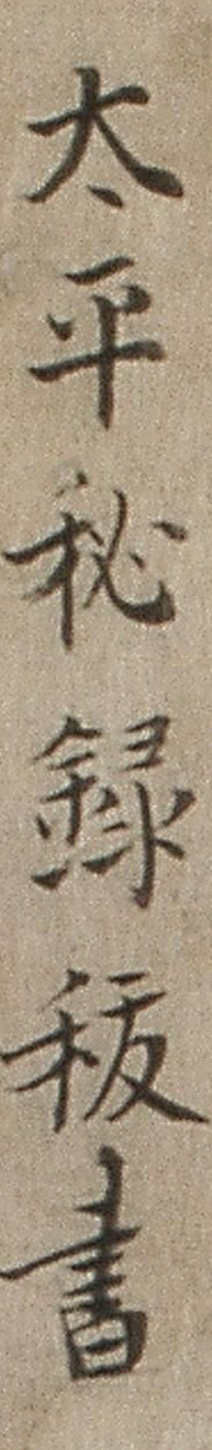太平秘録抜書
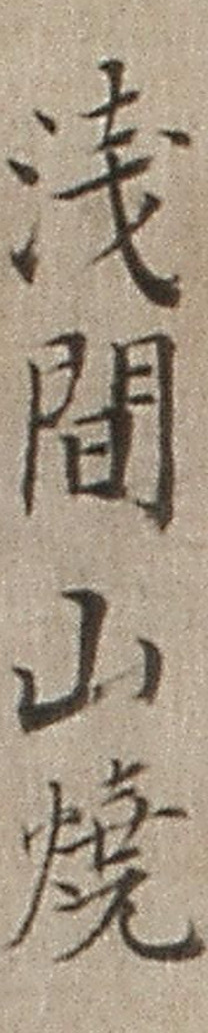浅間山焼
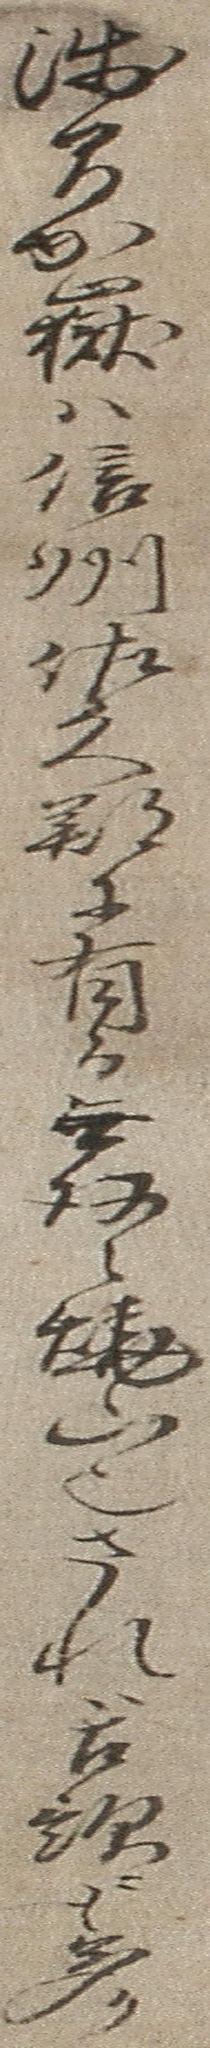浅間か嶽は信州佐久郡に有而無双之焼山也されは古歌ニも多ク
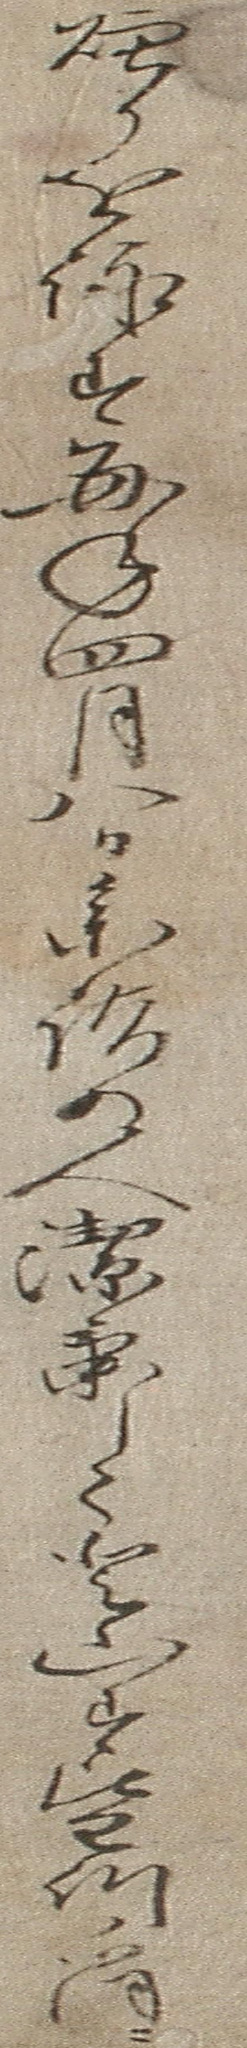煙りを詠す毎年四月八日参詣の人潔斎して登山す皆竹ノ筒ニ
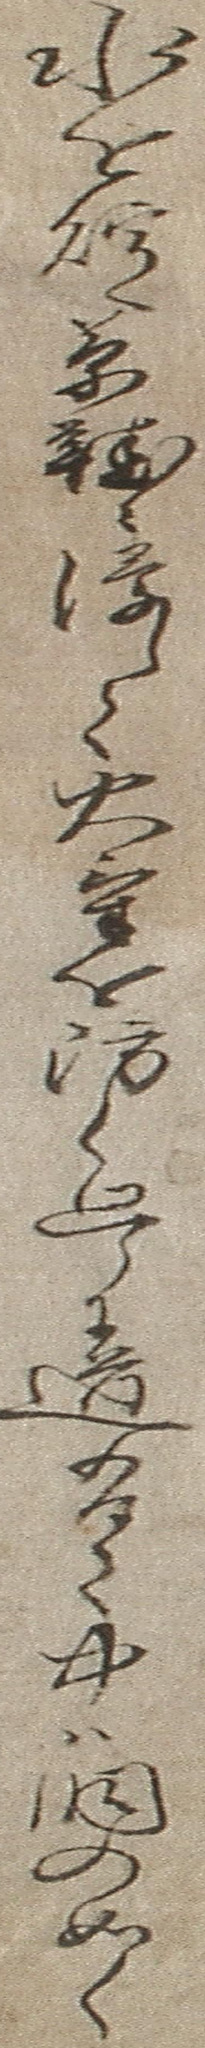水を貯へ草鞋ニ浸して火気を防く廻りに道有之中は洞の如く
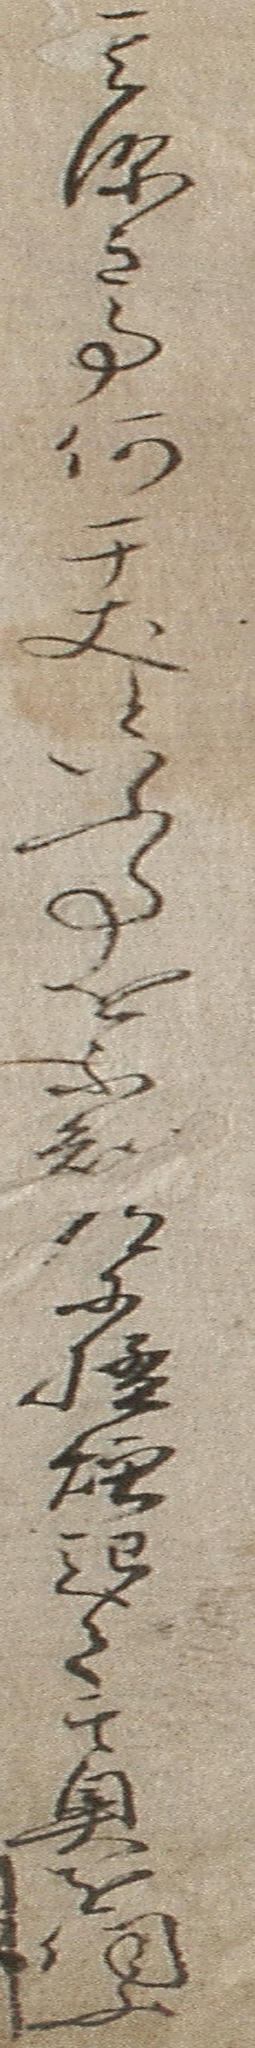其深き事何千丈といふ事を不知常に猛煙起て其奥を伺ふ事
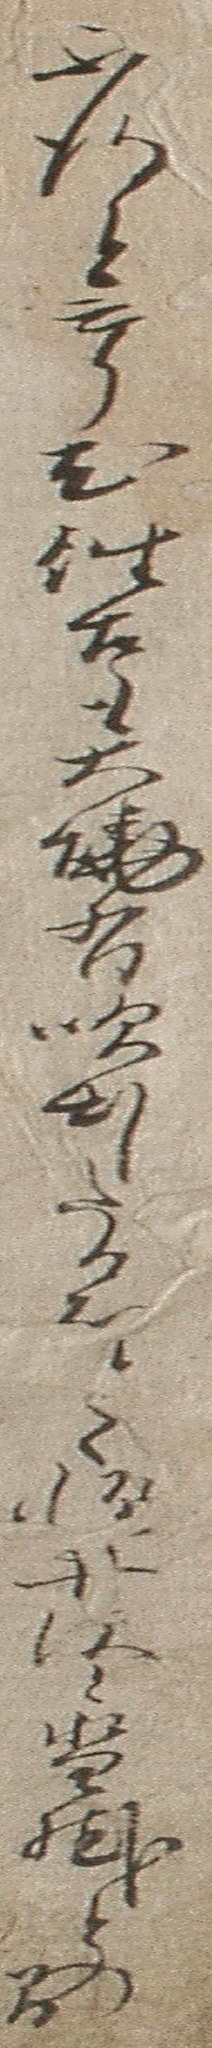不得と云り尤往古も大焼有吹出したり之？軽井沢と沓掛との間
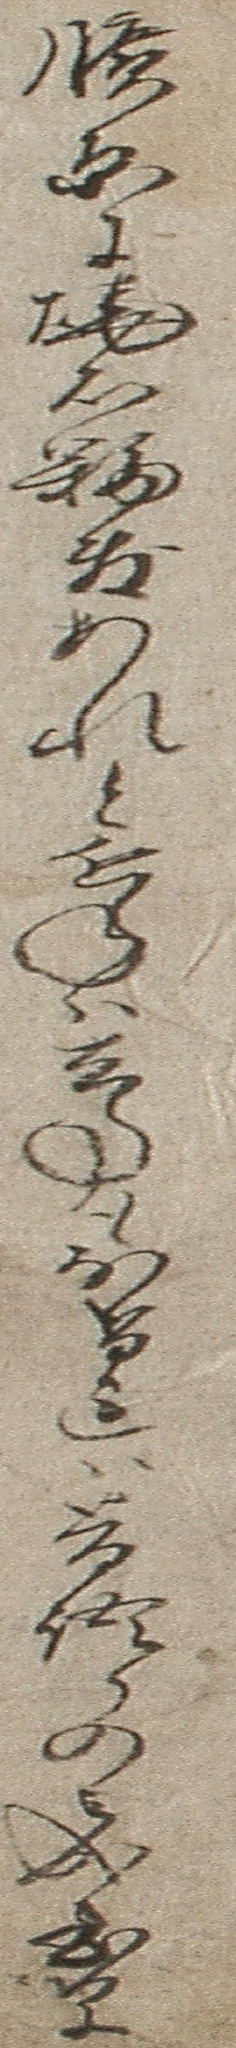曠原に焼石夥敷あれと近年は去事もなけれは昔？語りのみ成も至候に
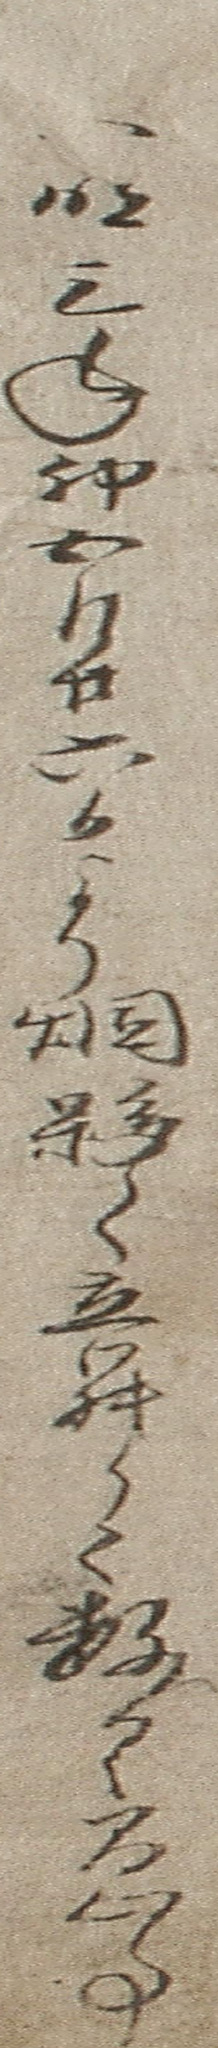明三年卯五月廿六日より烟夥しく立昇りて数日の間止事

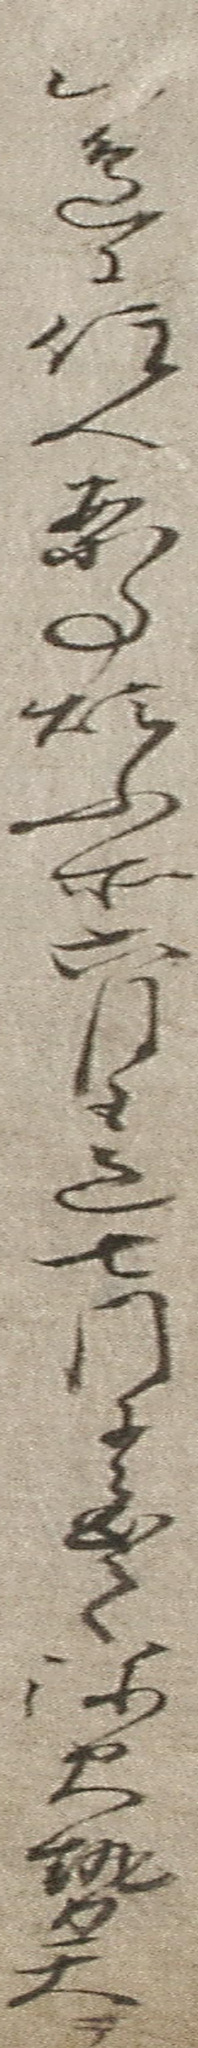なく辺に住人案事煩ふ所六月も過七月に至て弥火勢天ヲ
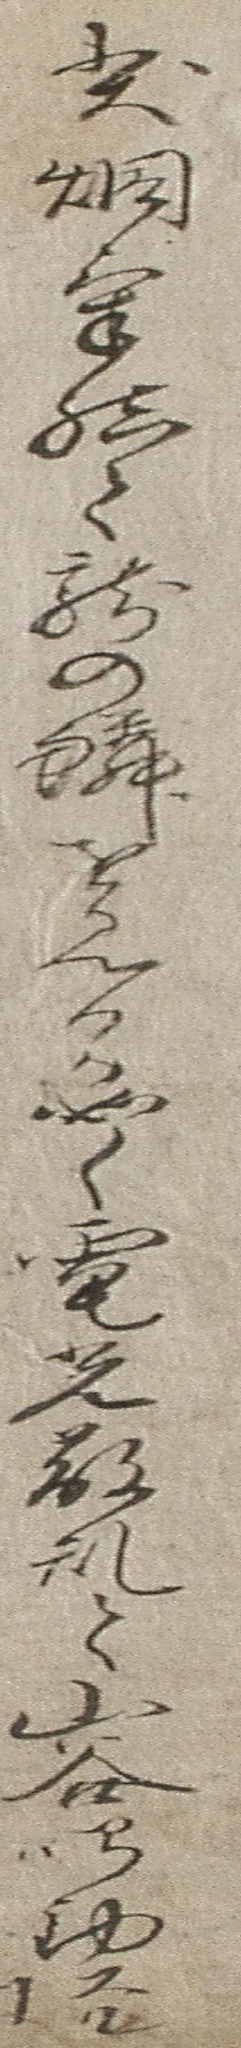尖烟気結て龍の鱗を見るか如く電光散乱て山谷鳴動する事
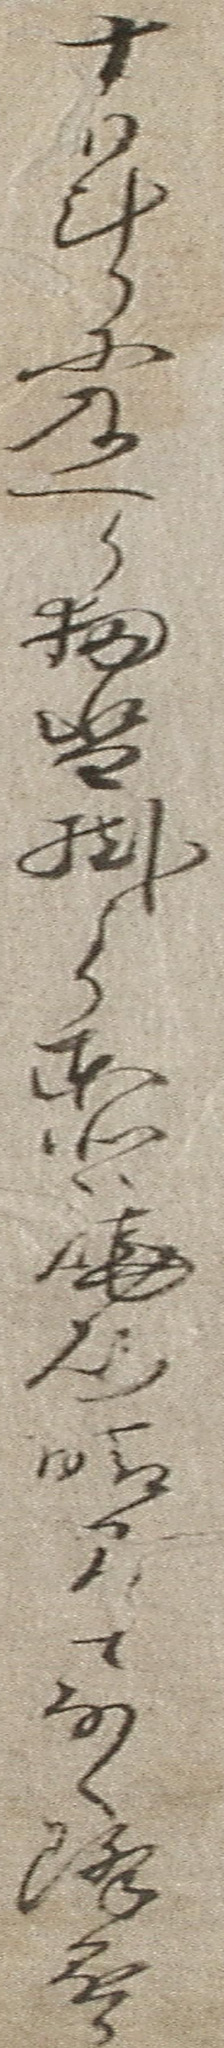十日計りに及へり扨沓掛より東北は焼石晴間もなく降懸り
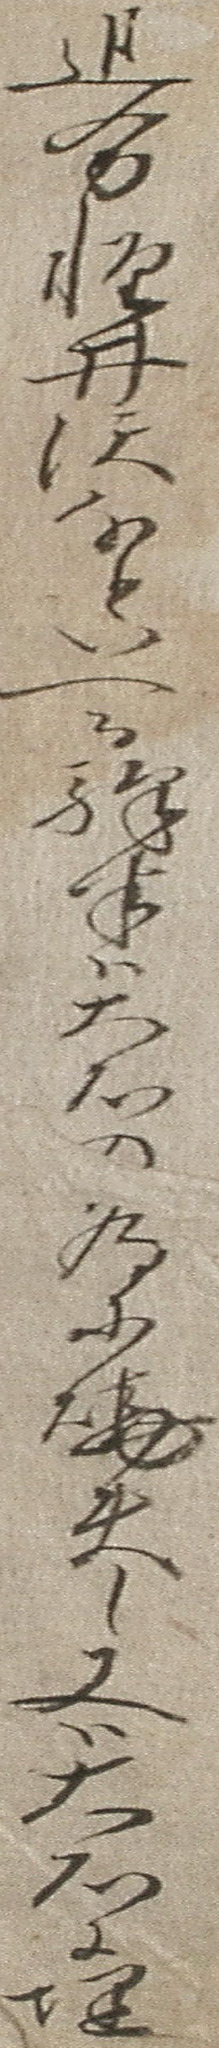追分軽井沢なといへる駅半は大石の為に焼失し又は大石に埋
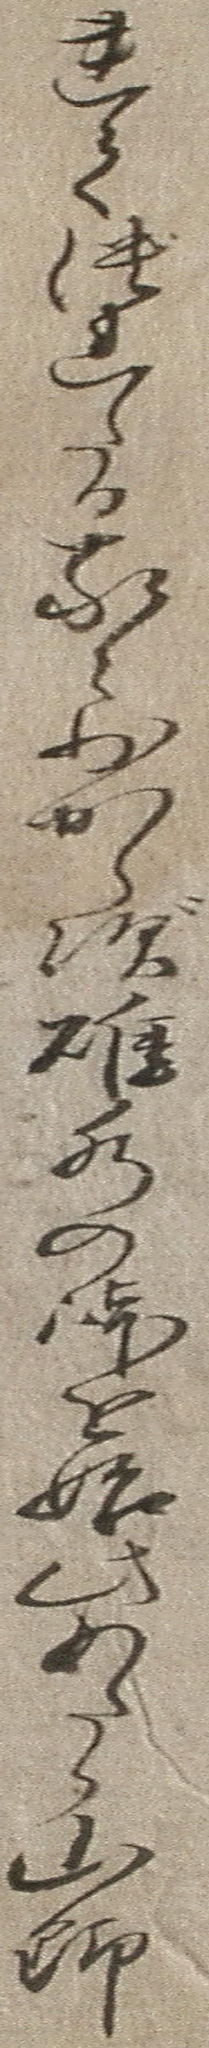れて潰れたる間家々少からず碓氷の峠を始此あたり山路
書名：太平秘録抜書　浅間山燒及普賢山崩
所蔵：東京大学地震研究所図書室 Earthquake Research Institute Library, The University of Tokyo, JAPAN
